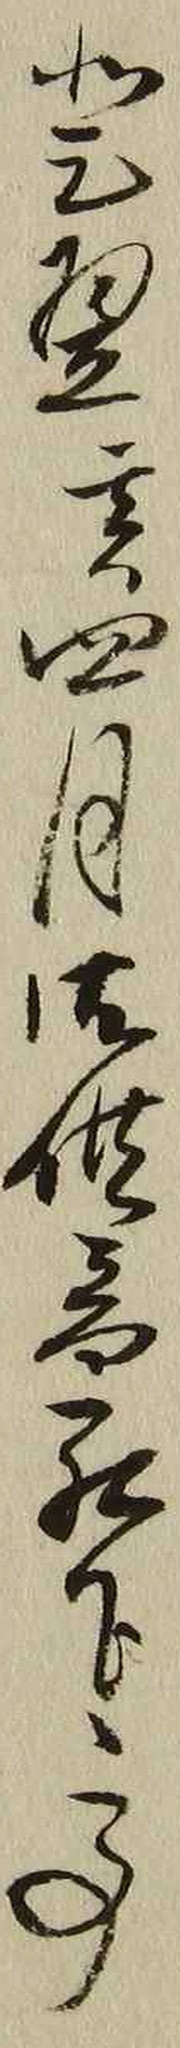登翌亥四月御供ニ而罷下候事
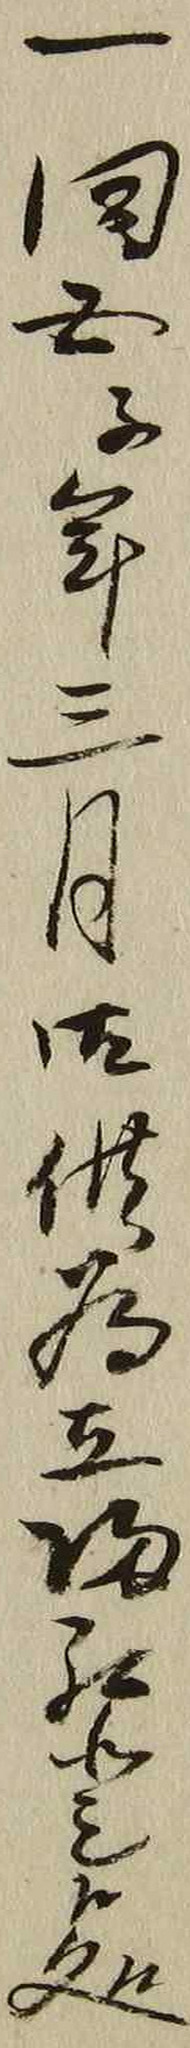一同五子年三月御供為立帰罷登候処
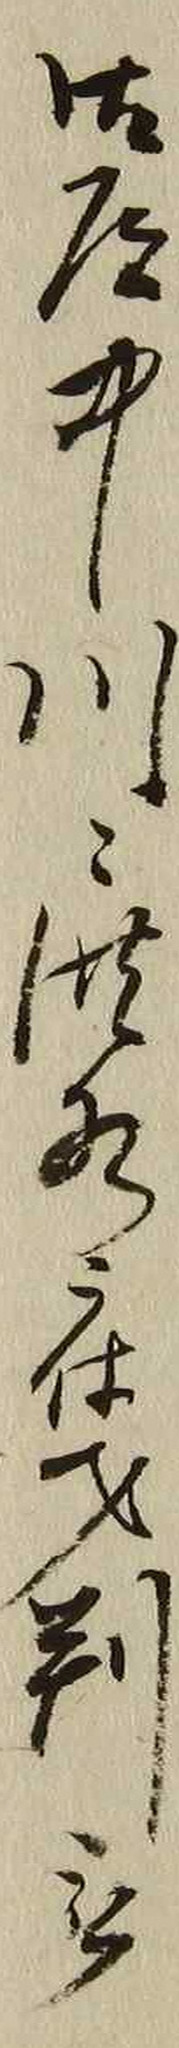御道中川々洪水ニ付才判被
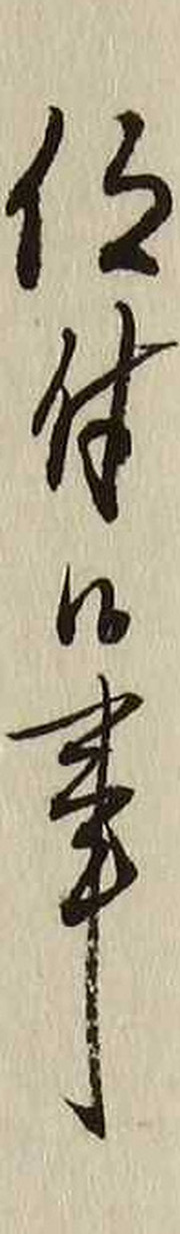仰付候事
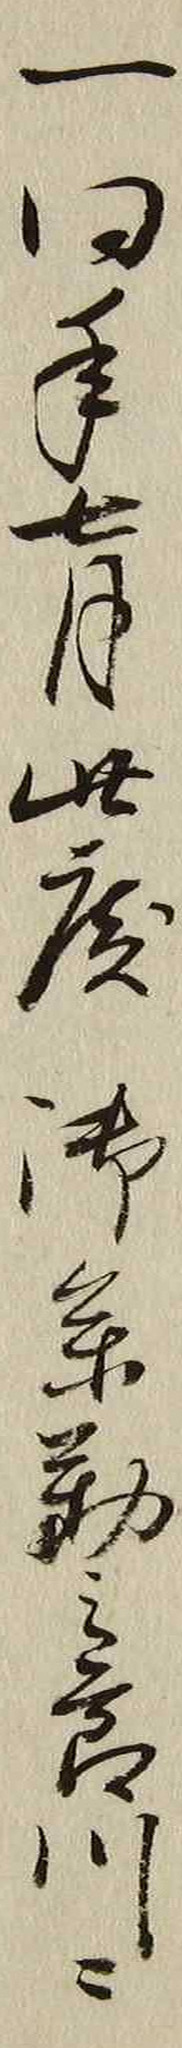一同年七月此度御参勤之節川々
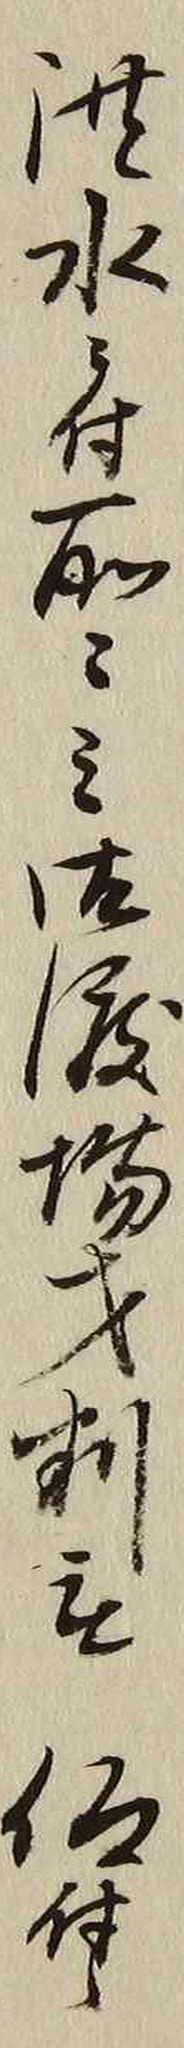洪水ニ付所々之御渡場才判被仰付候
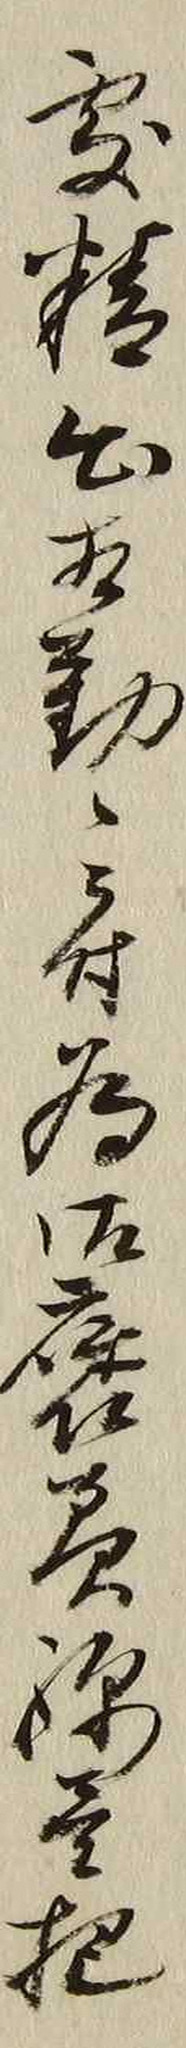処精出相勤候ニ付為御褒美綿壱把
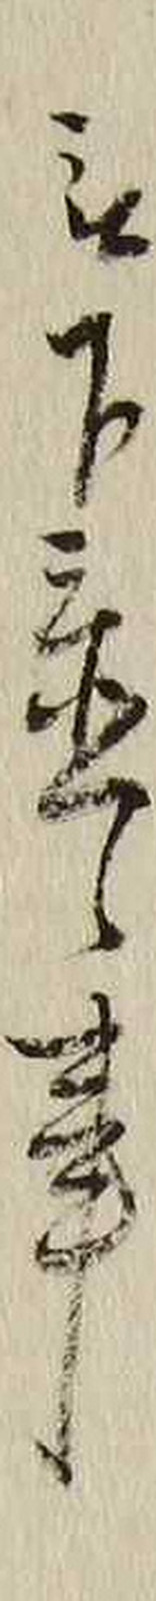被下置候事
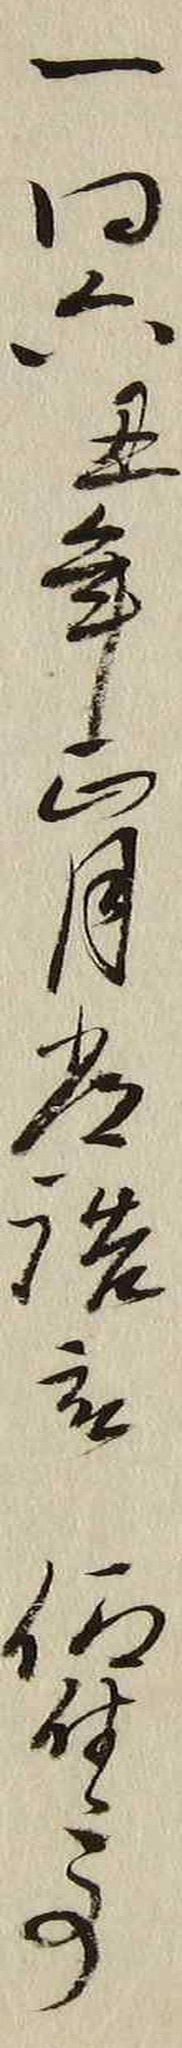一同六丑年正月常詰被仰付候事
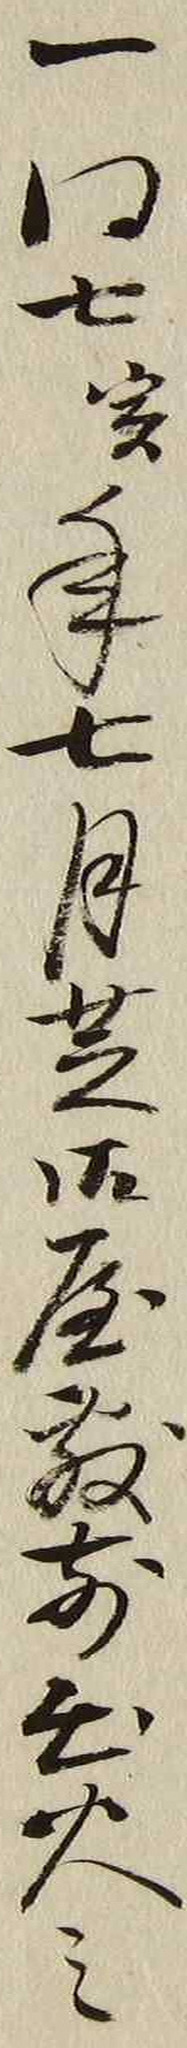一同七寅年七月芝御屋敷前出火之
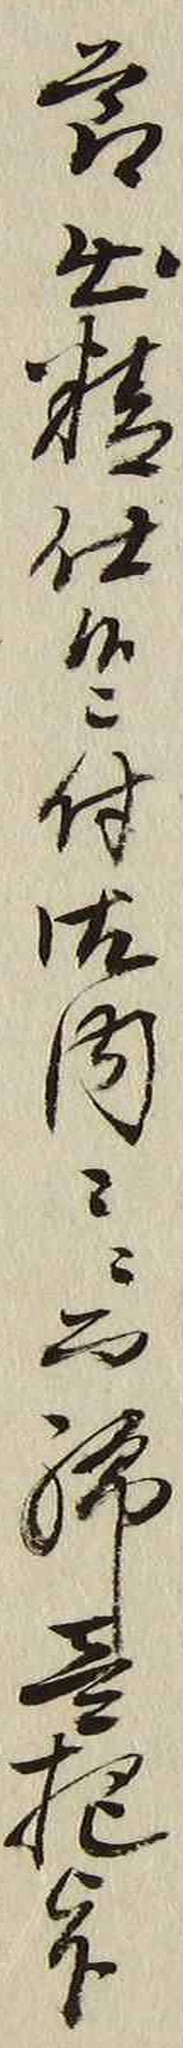節出精仕候ニ付御内々ニ而綿壱把被下
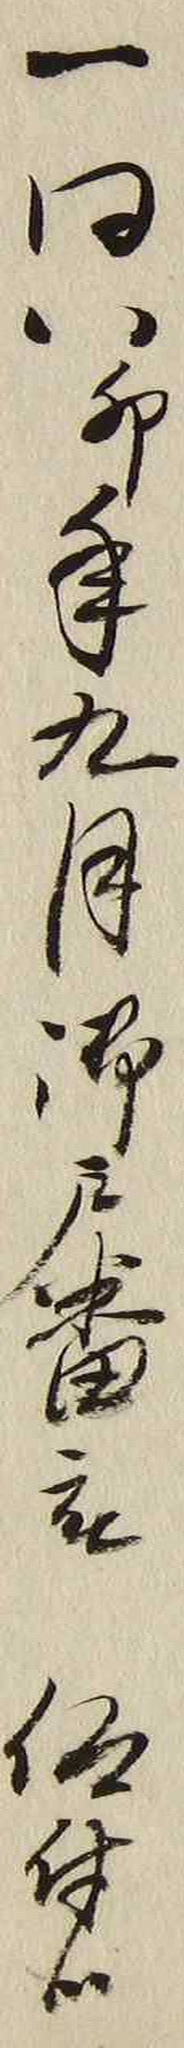一同八卯年九月御戸番被仰付候

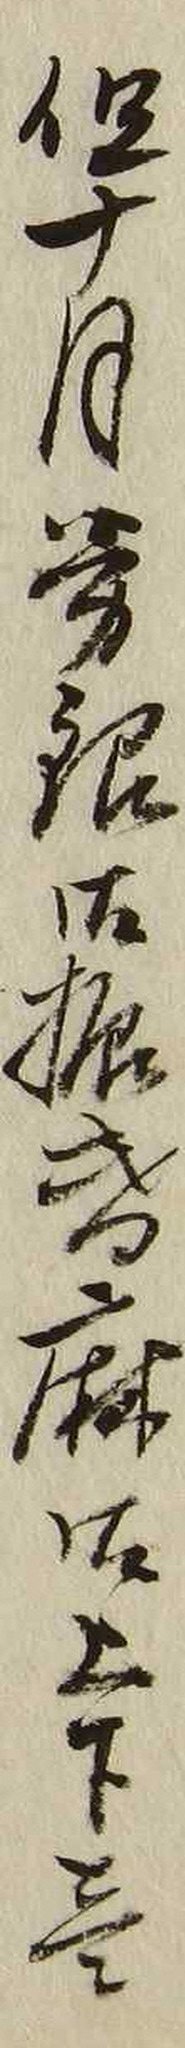但十月労銀御振替麻御上下壱
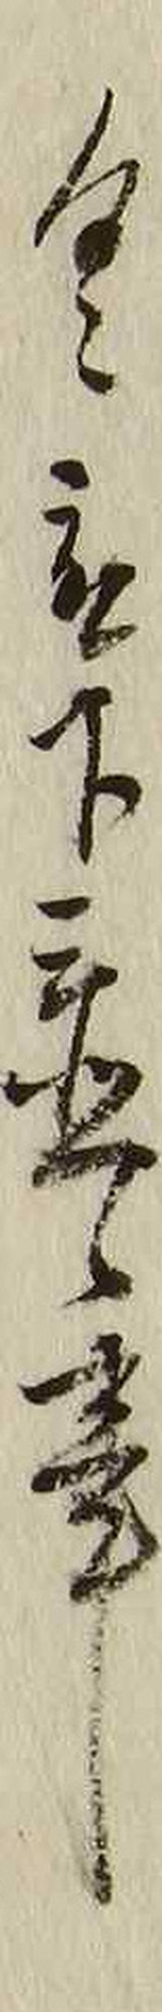具被下置候事
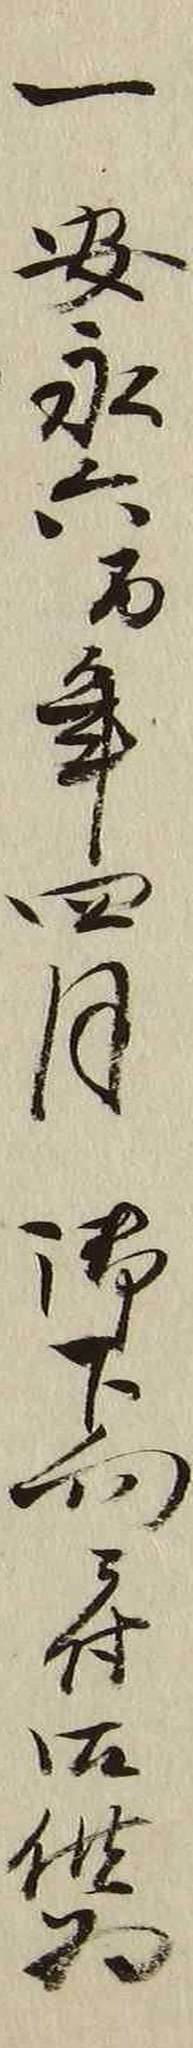一安永六酉年四月御下向ニ付御供為
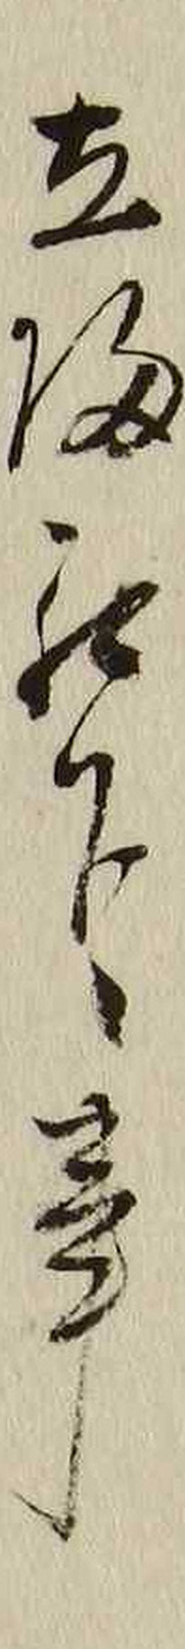立帰罷下候事
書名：諸士系譜　巻之352　す之部2
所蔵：会津若松市立会津図書館
